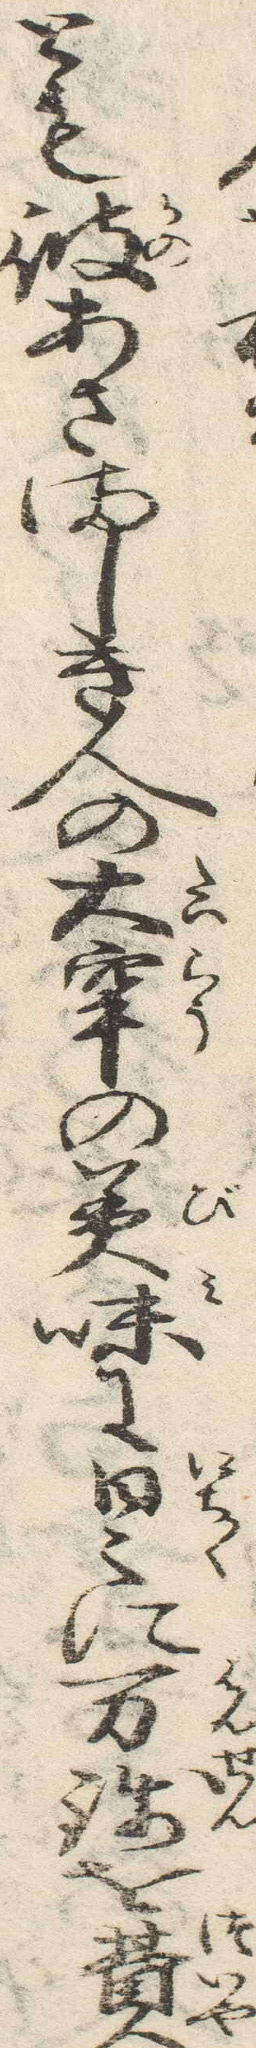とも彼あさましき人の大牢の美味に日々に万銭を費
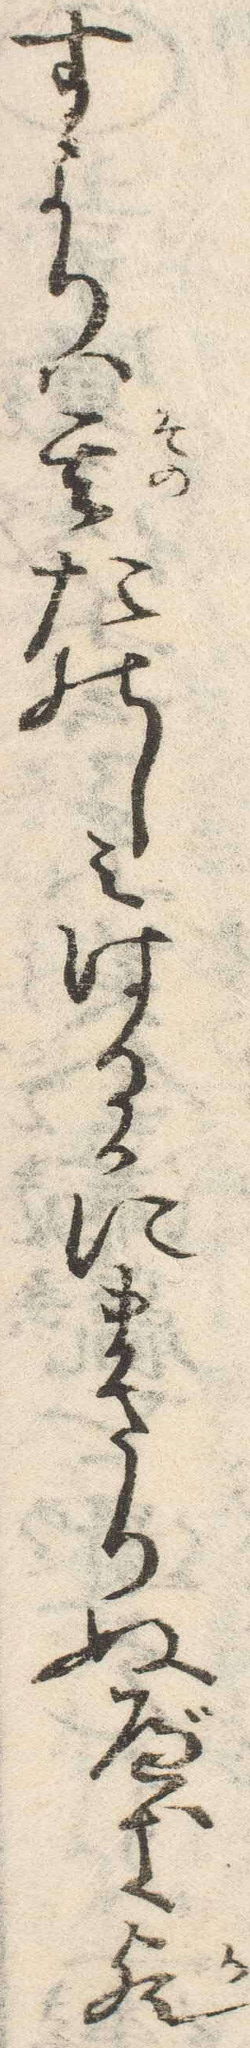すよりは其たのしみはるかにまさりぬべき歟
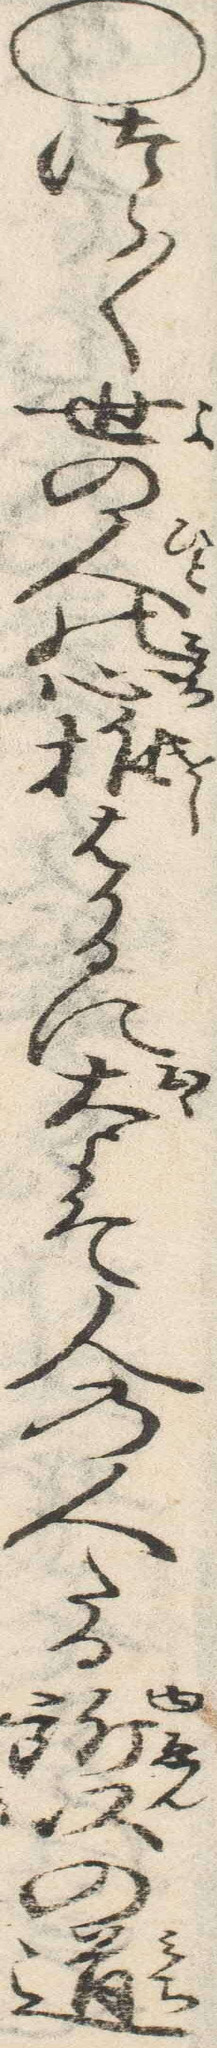○つら〳〵世の人の心推はかるに大よそ人の人たる所以の道
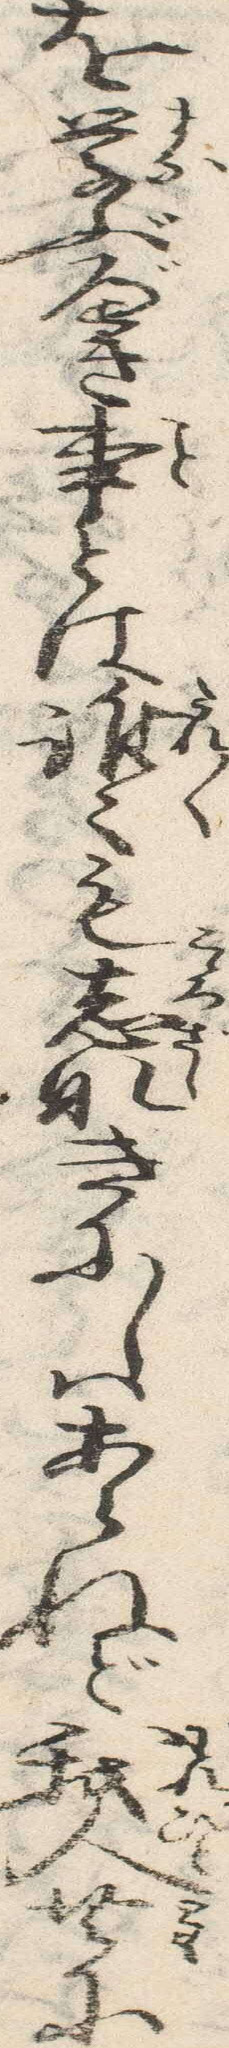を学ぶべき事とは誰々も志なきにしはあらねど我人共に
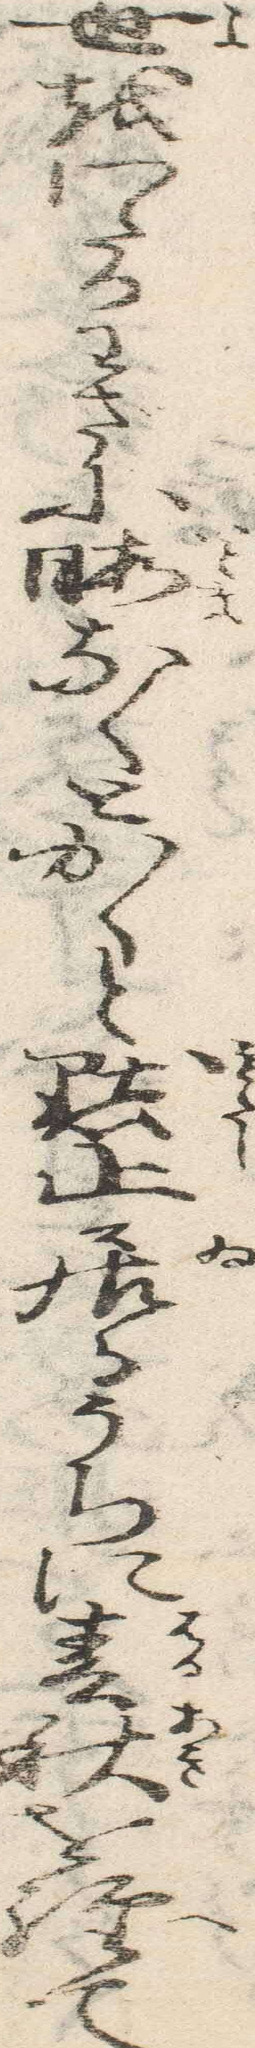世をわたるわさに暇なくとかくと黙止居るうちに春秋を経て
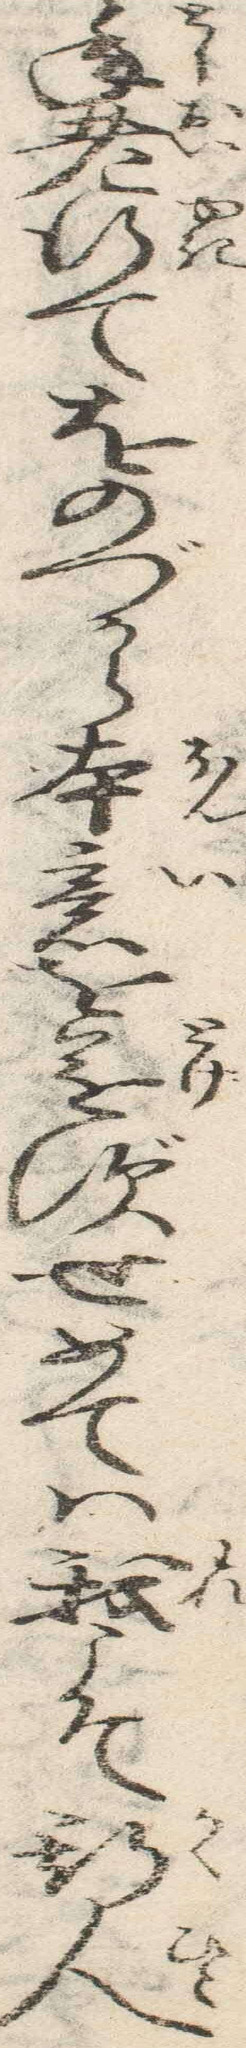年老行てをのづから本意を遂ずせめては我こそ斯人
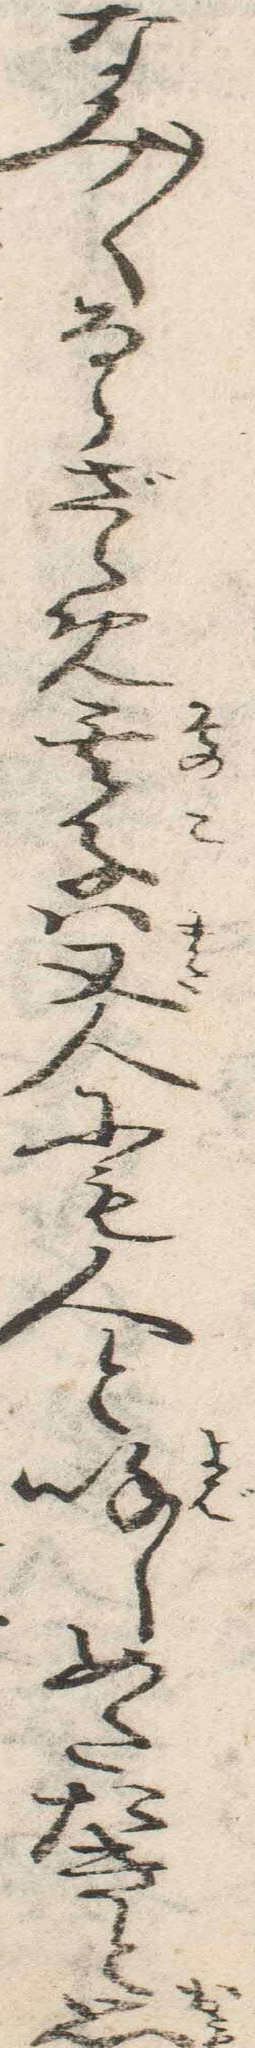なみ〳〵ならざらめ其子は又人にも人と呼しめたたきと思
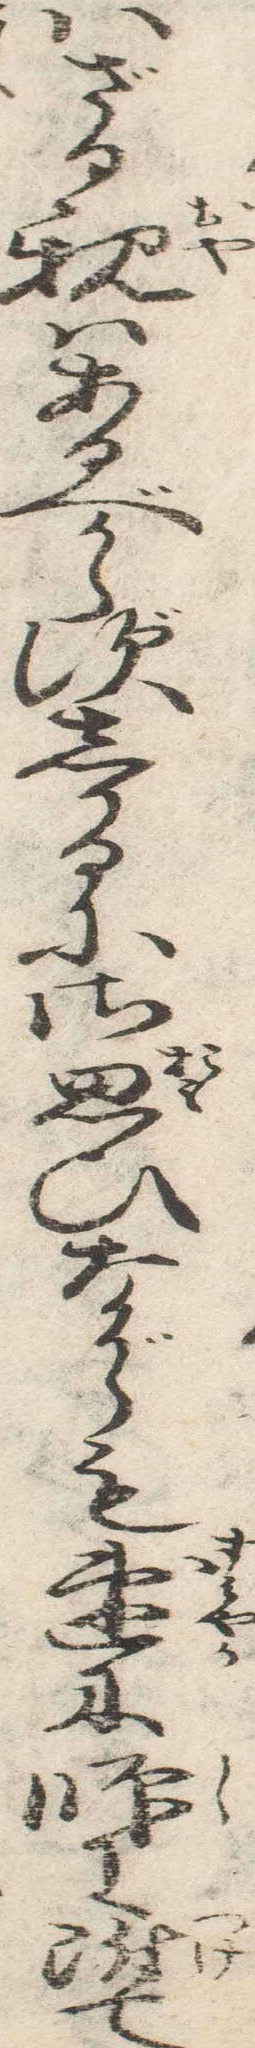はざる親はあるべからずしかるにさ思ひながらも速に師に付て
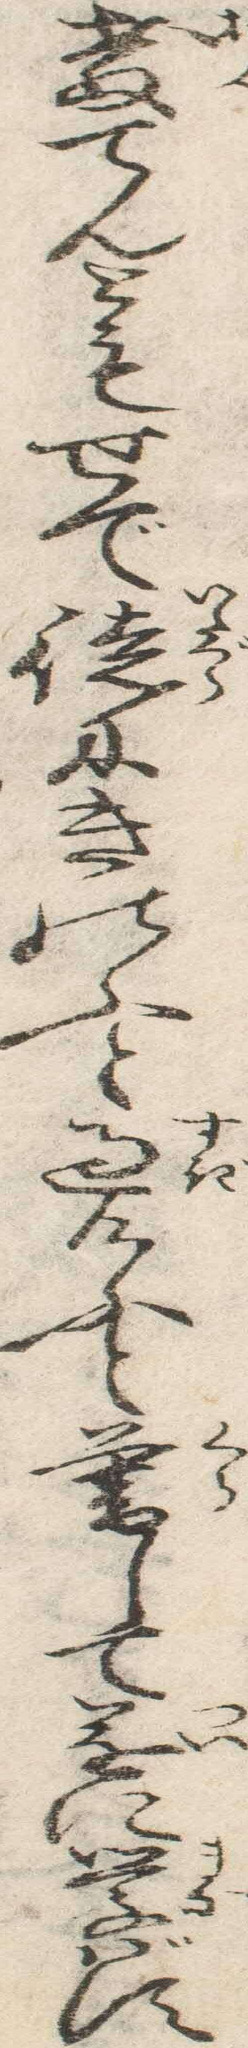教てんともせで徒にきのふと過けふと暮して遂に学ばす
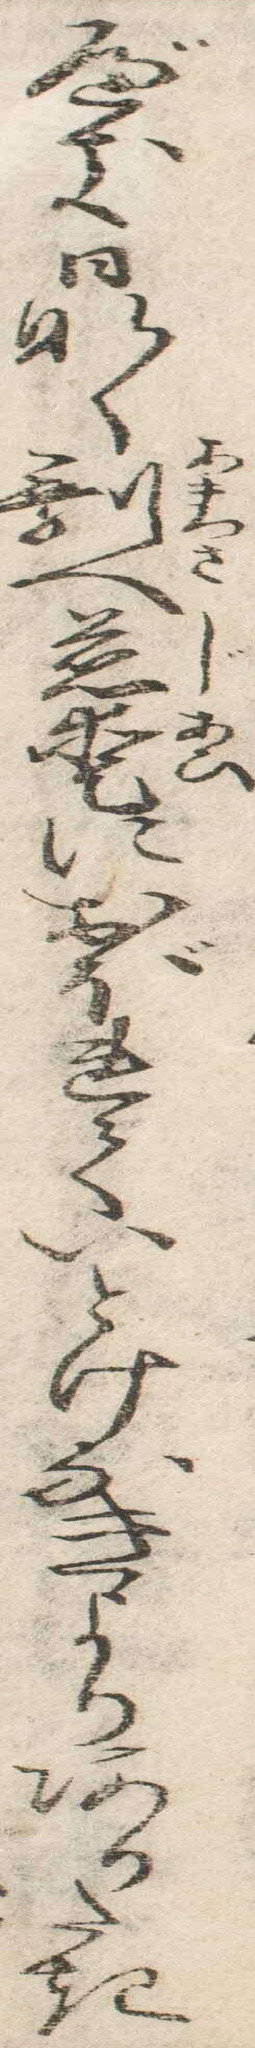べき日なく剰へ慈愛におぼれていとけなきよりありたき
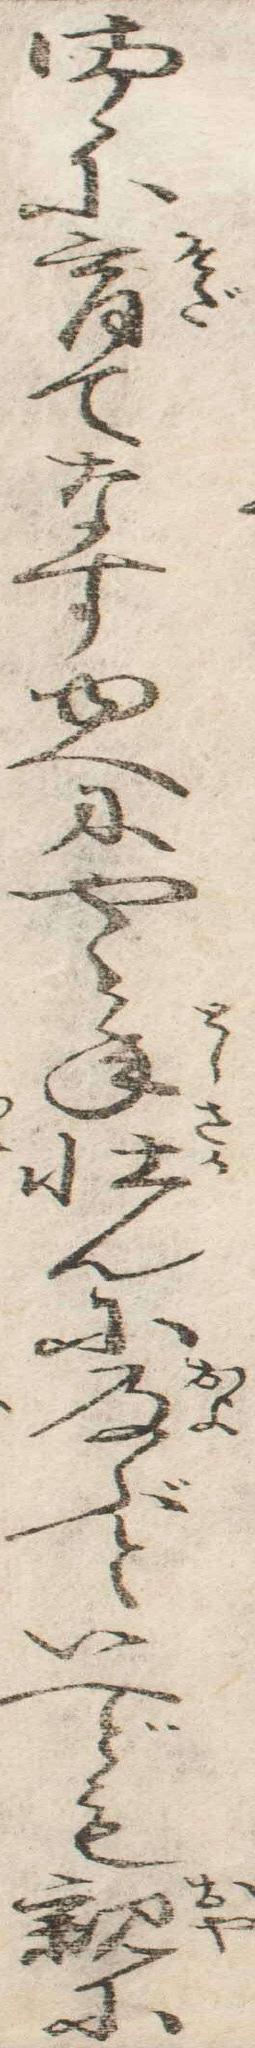まゝに育てなすゆへにやゝ年壮んに及ぶといへども親に
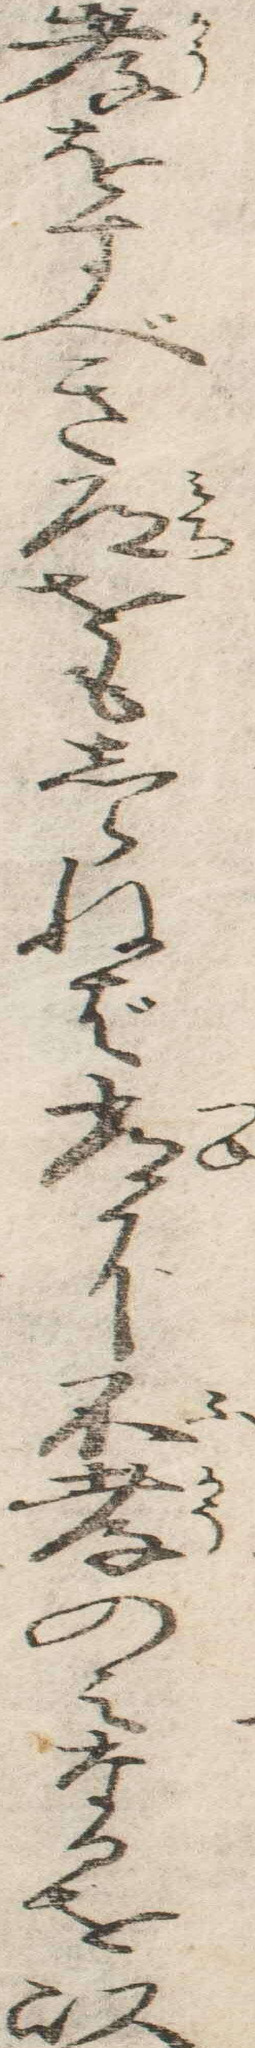孝をすべき道をもしらねば常に不孝のみなるを以
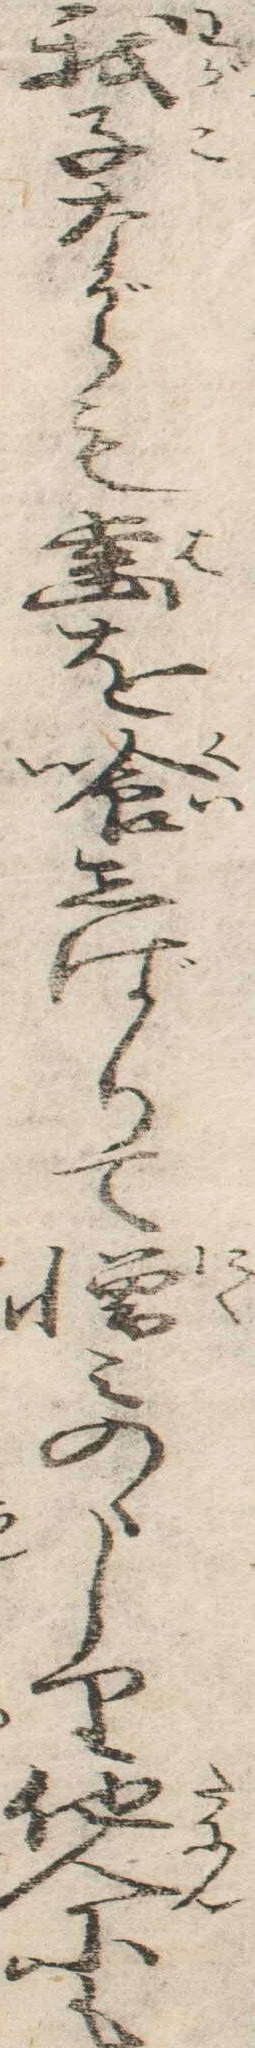我子ながらも歯を喰しばりて憎みのゝしり他人にも
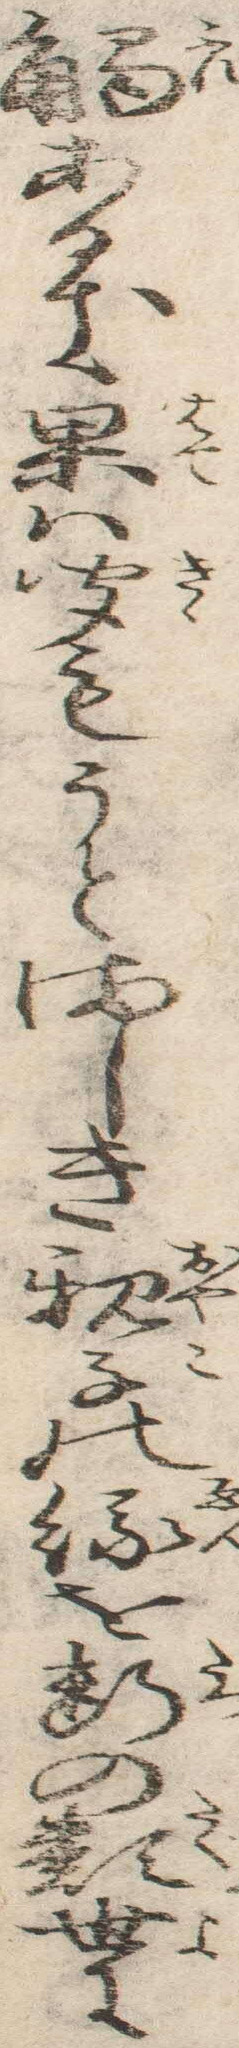触あるき果は聞もうとましき親子の縁を断の類世に

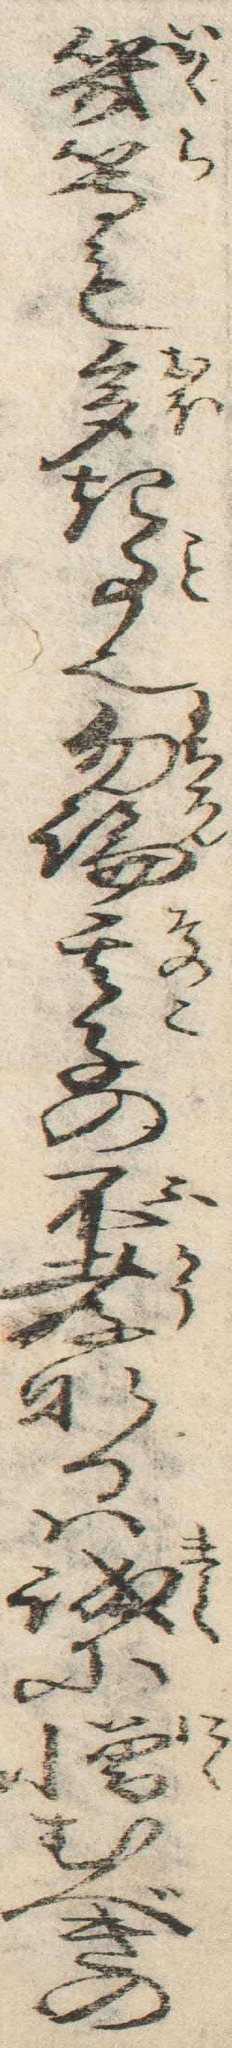幾等も多き事也勿論其子の不孝なるは誠に憎むべきの
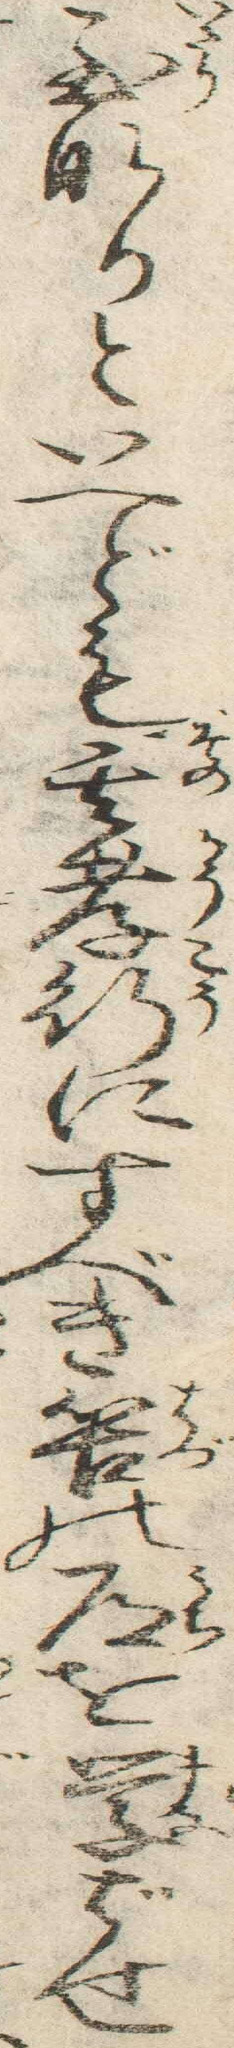至なりといへども其孝行にすべき筈の道を学ばせ
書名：撫育草
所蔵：東京学芸大学附属図書館 国文学研究資料館
